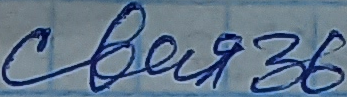свиязь
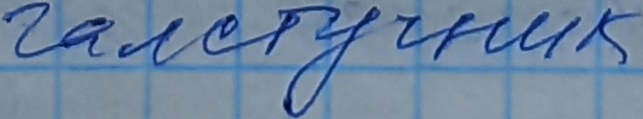галстучник
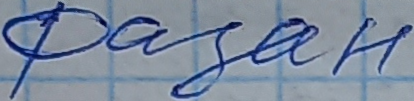фазан
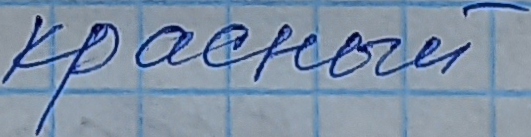красный
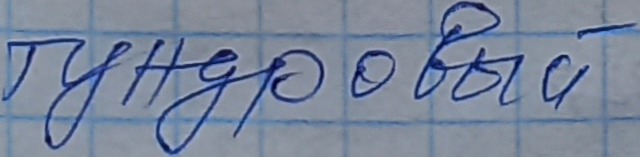тундровый
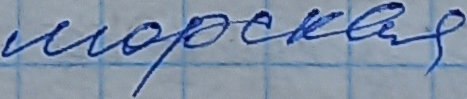морская
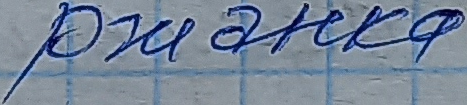ржанка
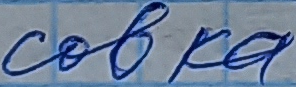совка
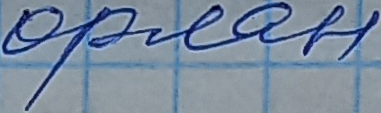орлан
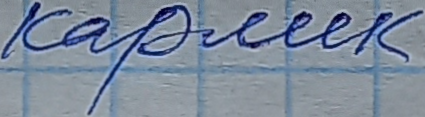карлик
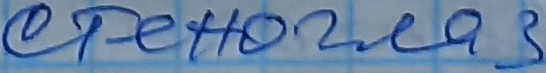стеноглаз
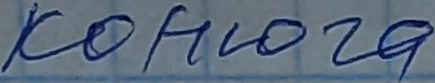конюга
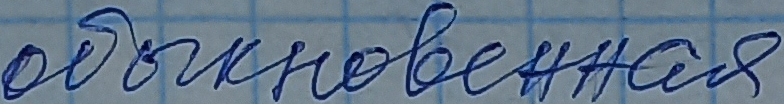обыкновенная
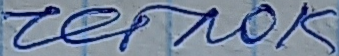чеглок
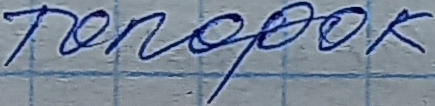топорок
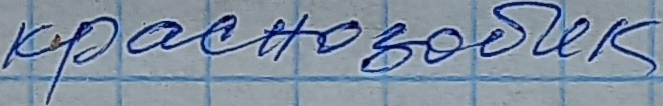краснозобик
